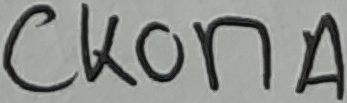скопа
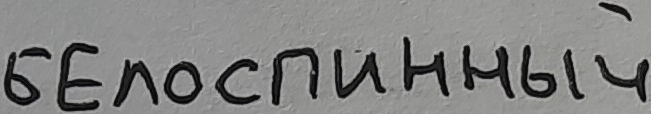белоспинный
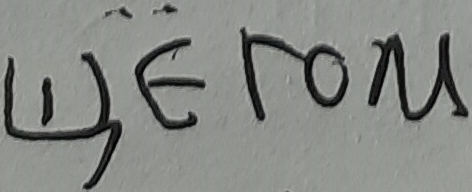щёголь
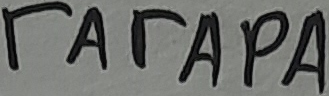гагара
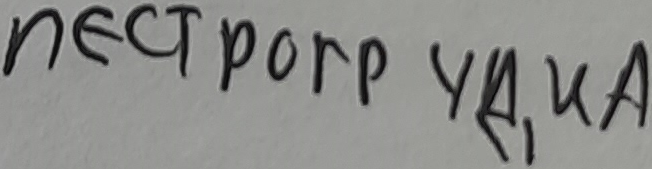пестрогр удка
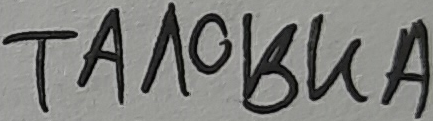таловка
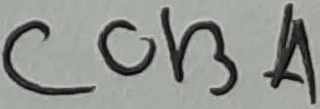сова
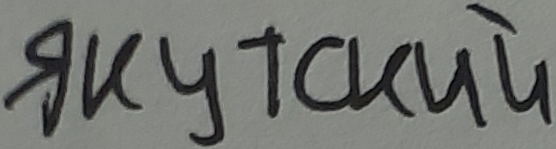якутский
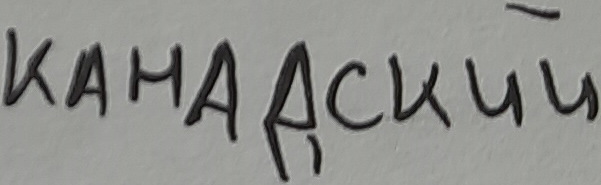канадский
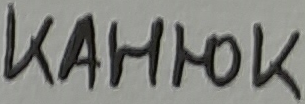канюк
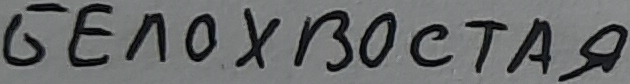белохвостая
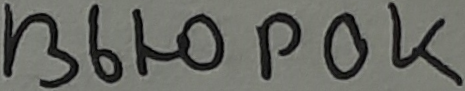вьюрок
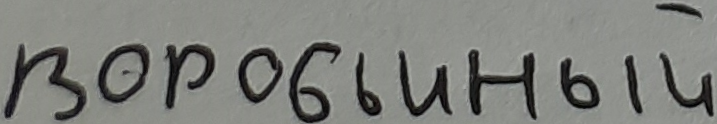воробьиный
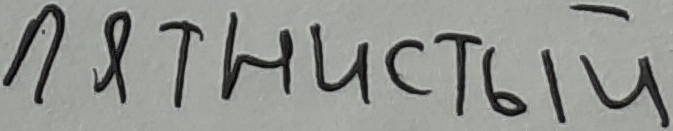пятнистый
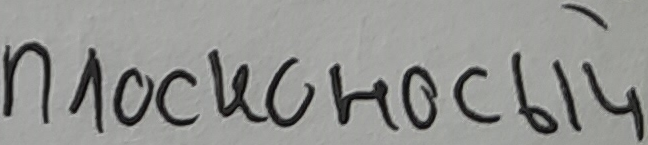плосконосый
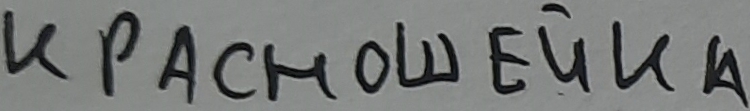красношейка
